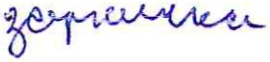зарничка
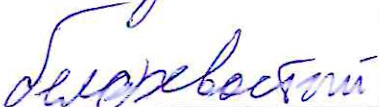белохвостый
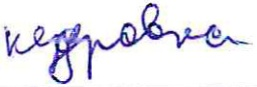кедровка
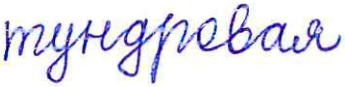тундревая
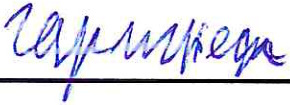гаршнеп
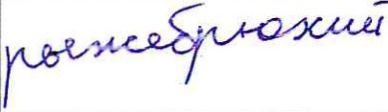рыжебрюхий
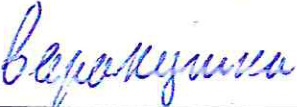варакушка
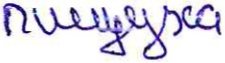пищуха
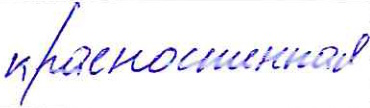красноспинная
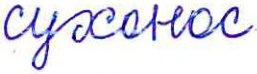сухонос
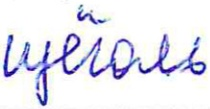щёголь
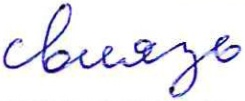свиязь
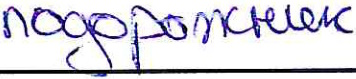подорожник
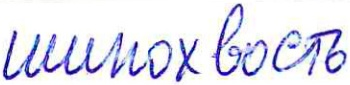шипохвость
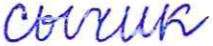сычик
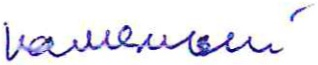камемый
